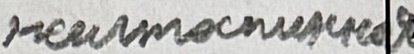желтоспинноя
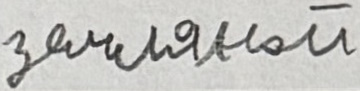земляной
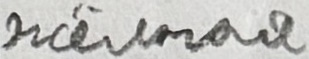жёлтая
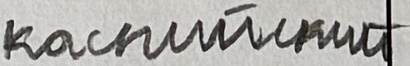каспийский
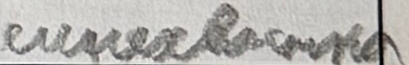синехвостка
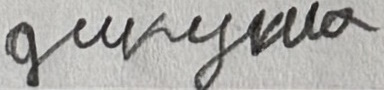дикуша
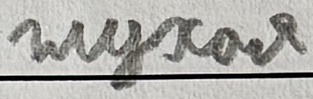глухая
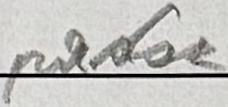рябок
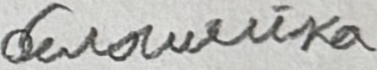белошейка
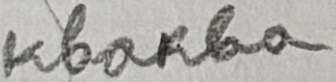кваква
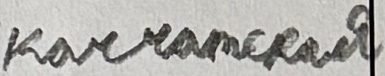каччатская
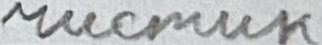чистик
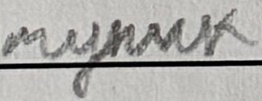тупик
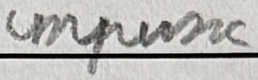стриж
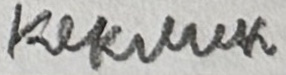кеклик
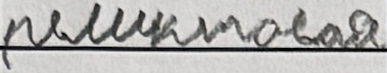реликтовая
